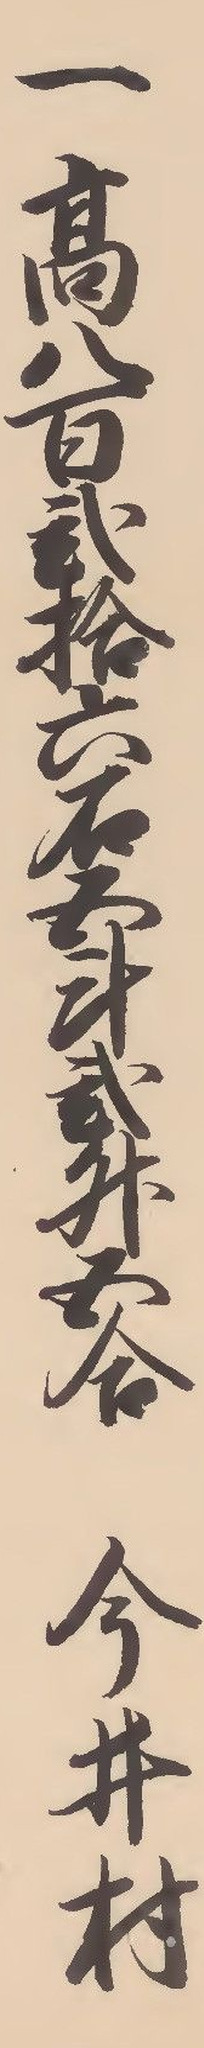一高八百弐拾六石五斗弐升五合今井村
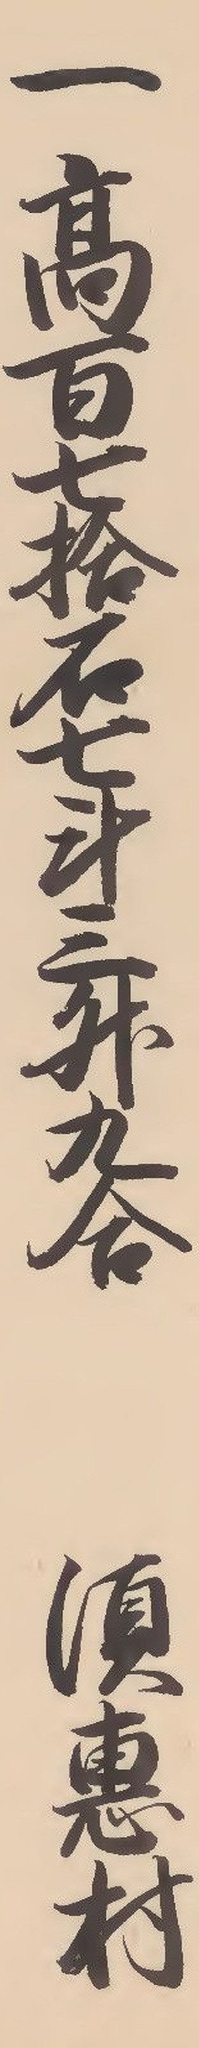一高百七拾石七斗三升九合須恵村
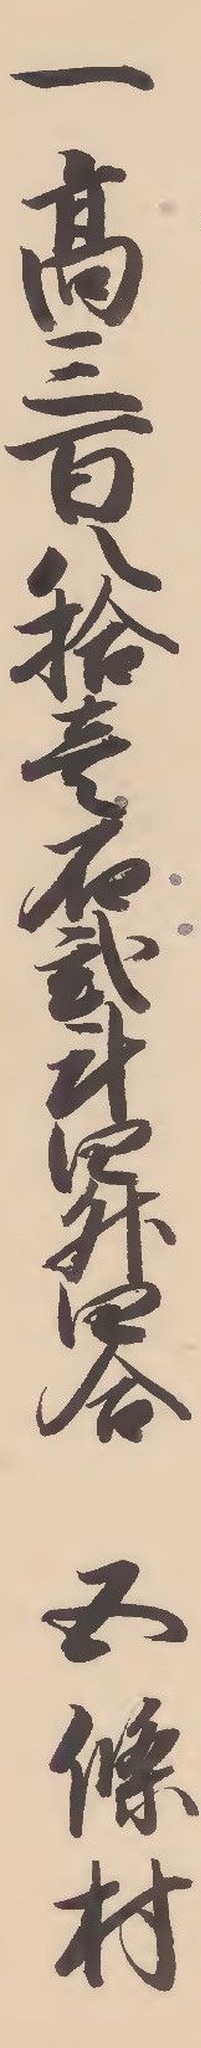一高三百八拾壱石弐斗四升四合五条村

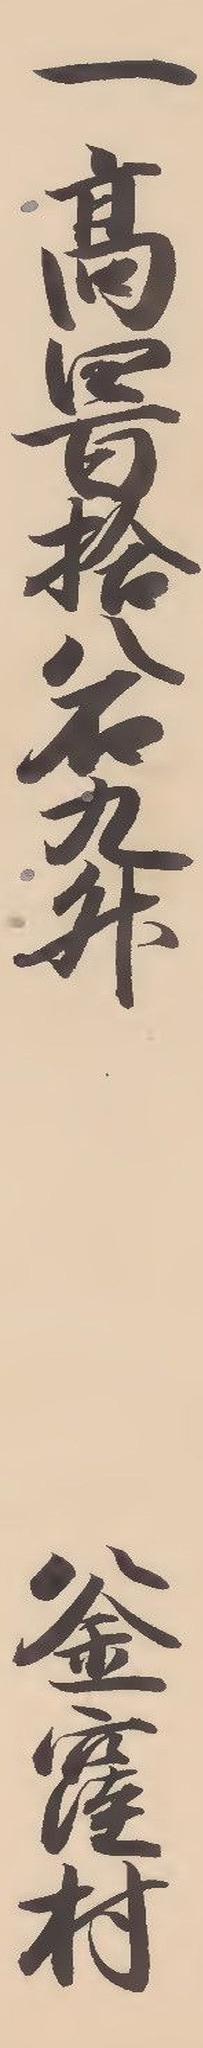一高四百拾八石九升釜窪村
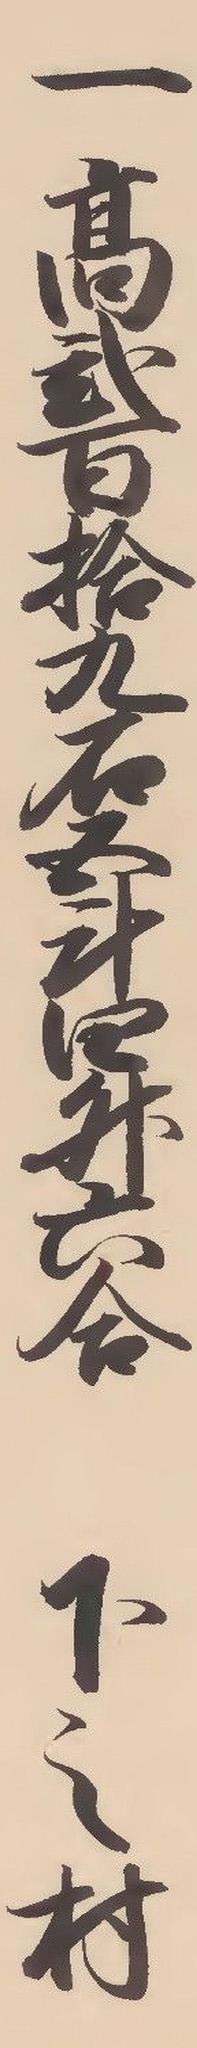一高弐百拾九石五斗四升六合下之村
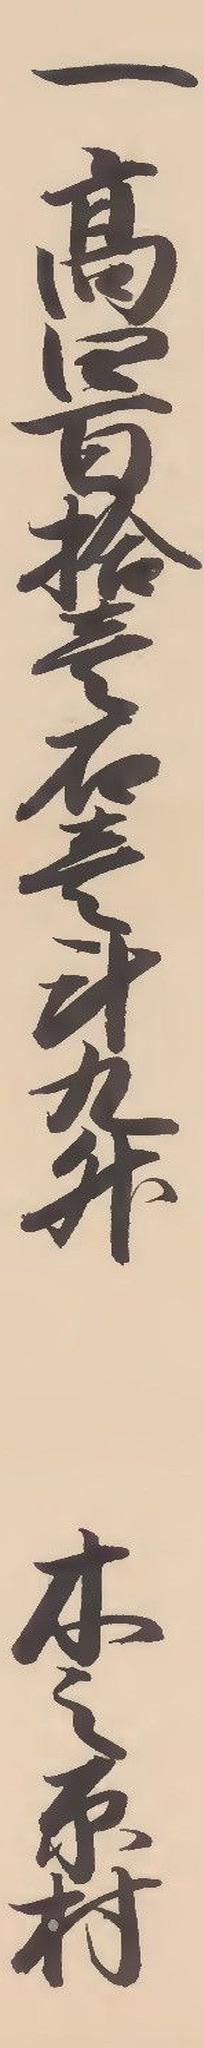一高四百拾壱石壱斗九升木之原村
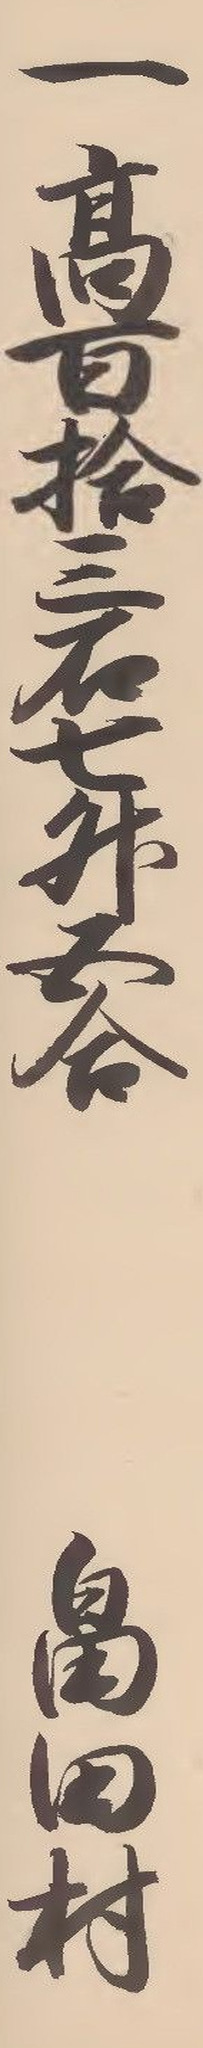一高百拾三石七升五合畠田村
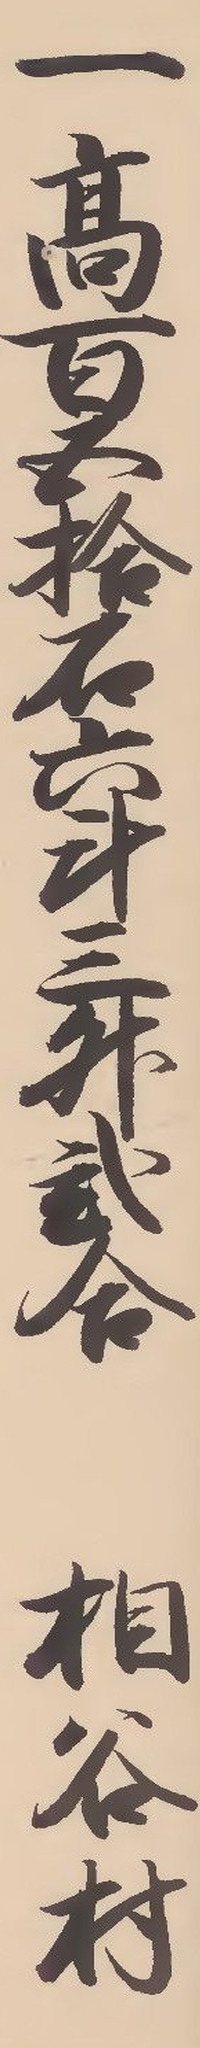一高百五拾石六斗三升弐合相谷村
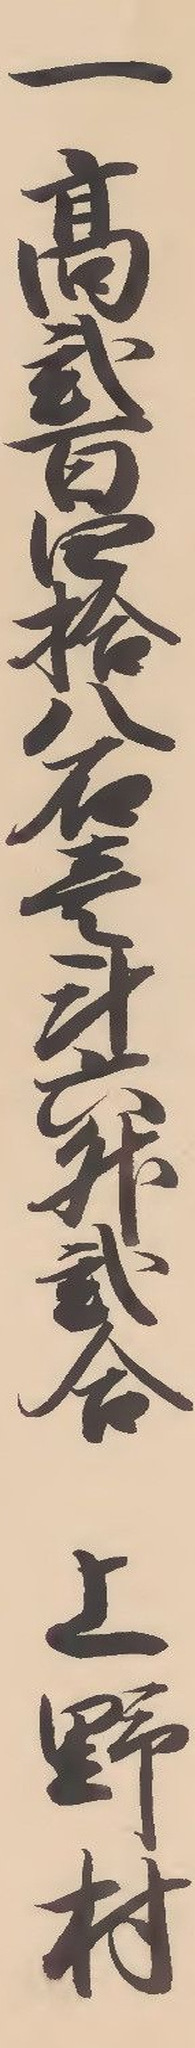一高弐百四拾八石壱斗六升弐合上野村
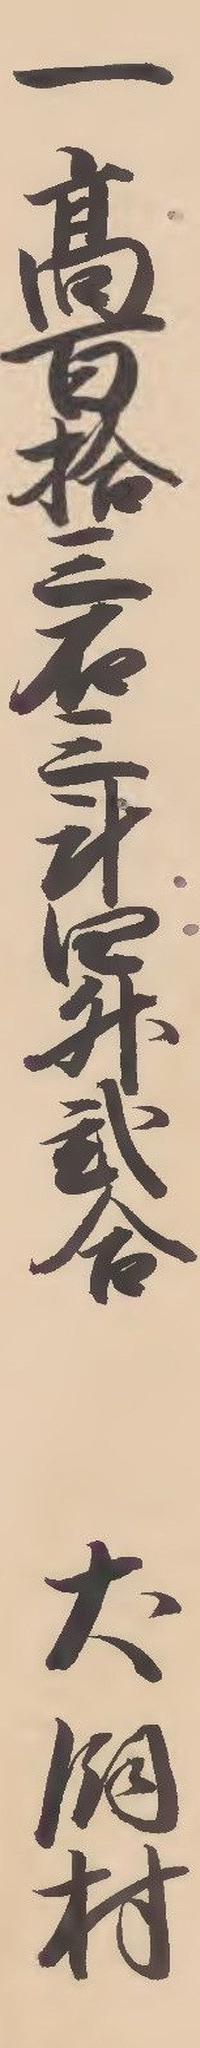一高百拾三石三斗四升弐合犬飼村

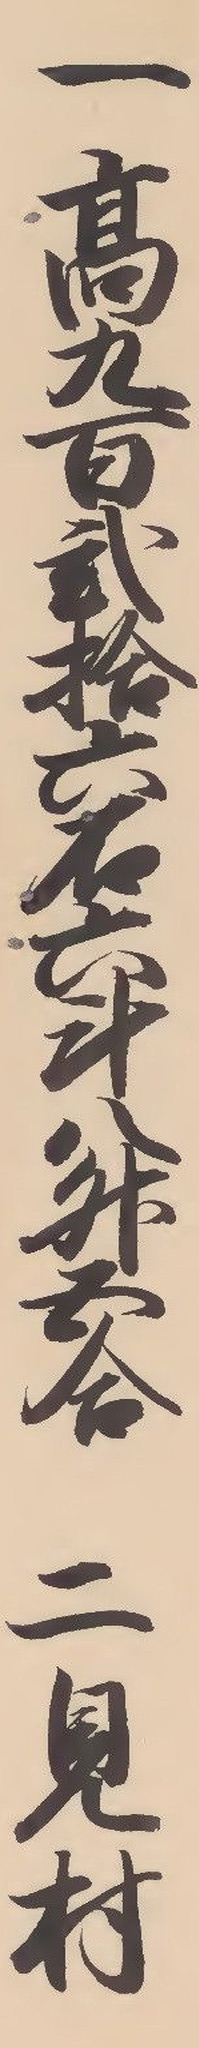一高九百弐拾六石六斗八升五合二見村
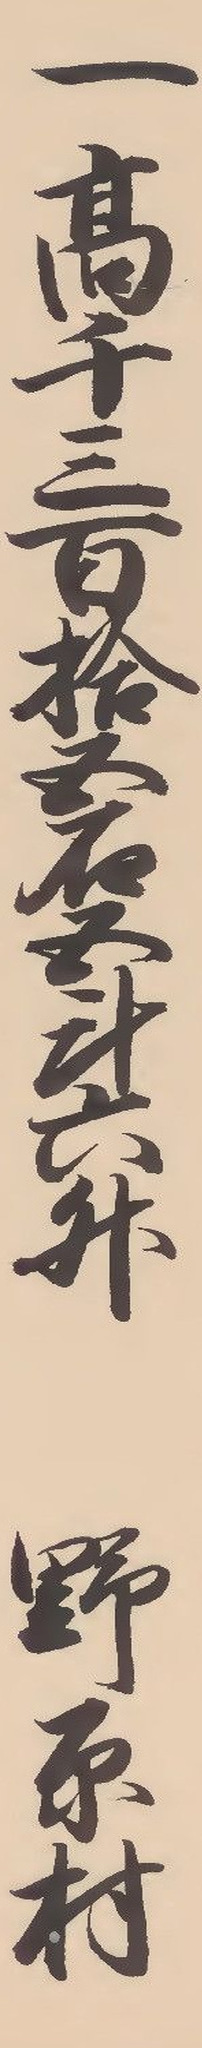一高千三百拾五石五斗六升野原村
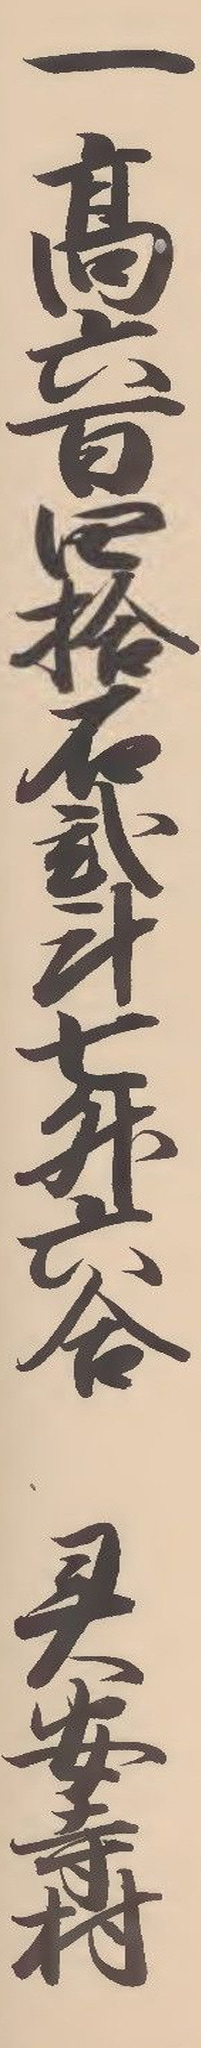一高六百四拾石弐斗七升六合霊安寺村
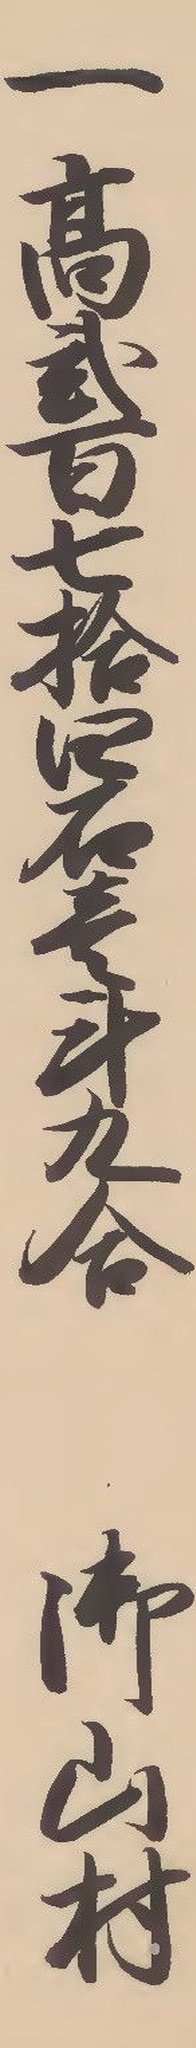一高弐百七拾四石壱斗九合御山村
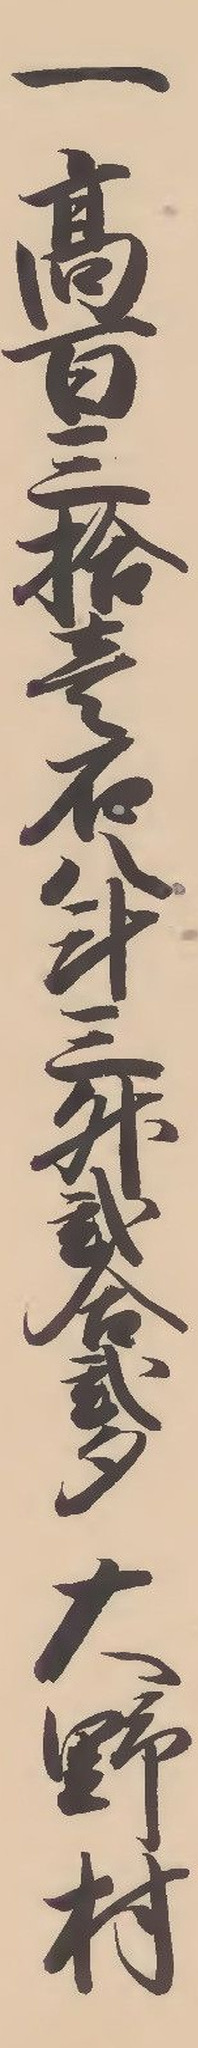一高百三拾壱石八斗三升弐合弐勺大野村

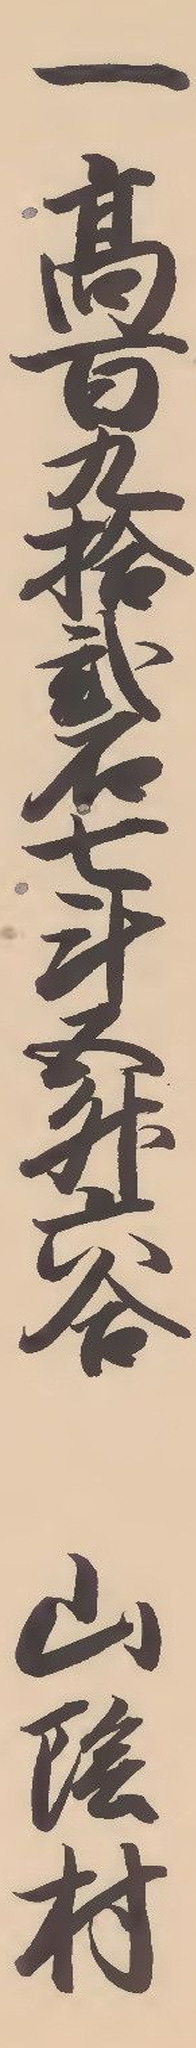一高百九拾弐石七斗五升六合山陰村
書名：大和国郷帳
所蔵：国立公文書館 National Archives of Japan
